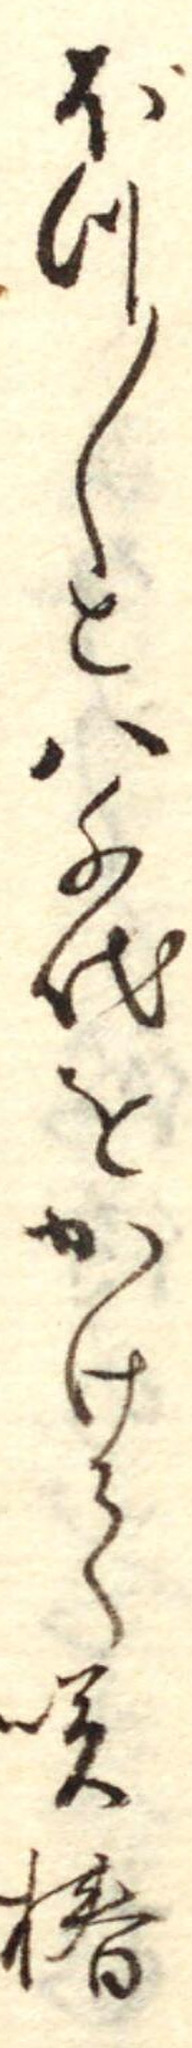ぼつ〳〵と八千代をかけて咲椿
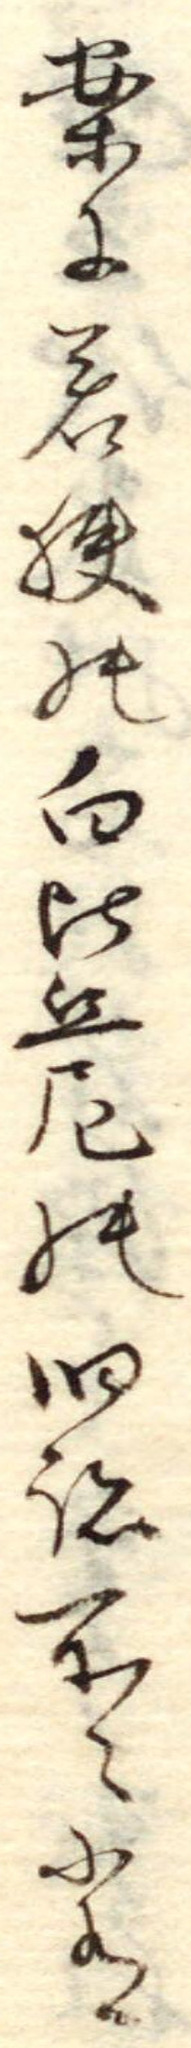案に若狭の白比丘尼の旧跡所々に有
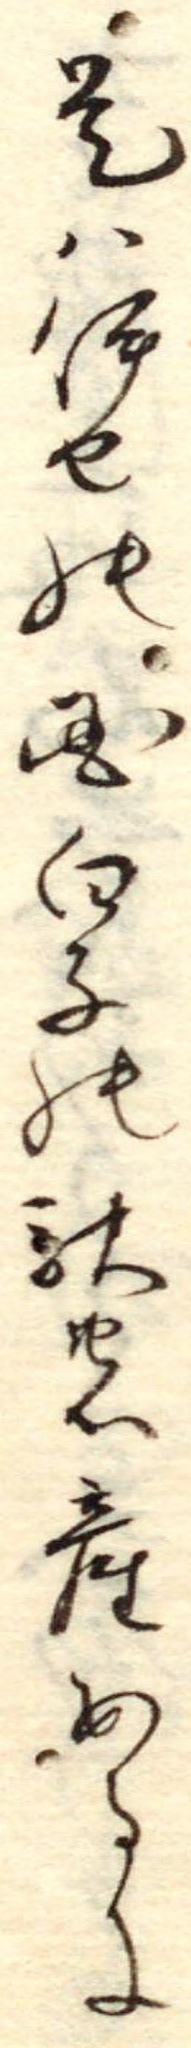是は伊せの国白子の駅の産あるに
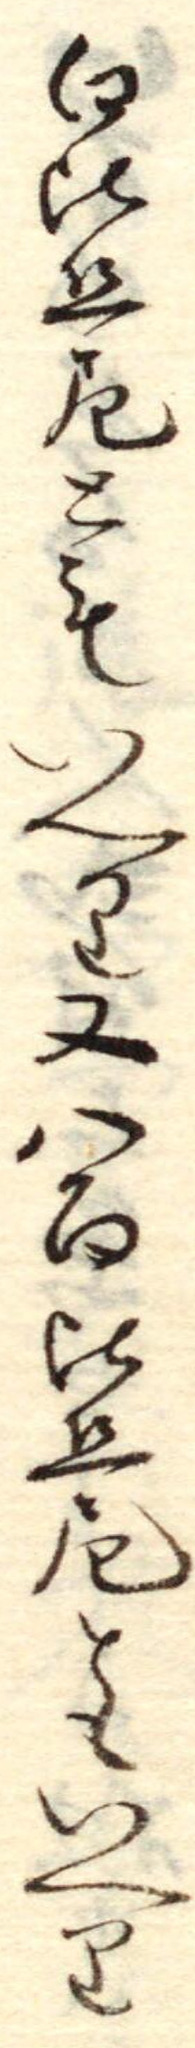白比丘尼ともいへり又八百比丘尼ともいへり
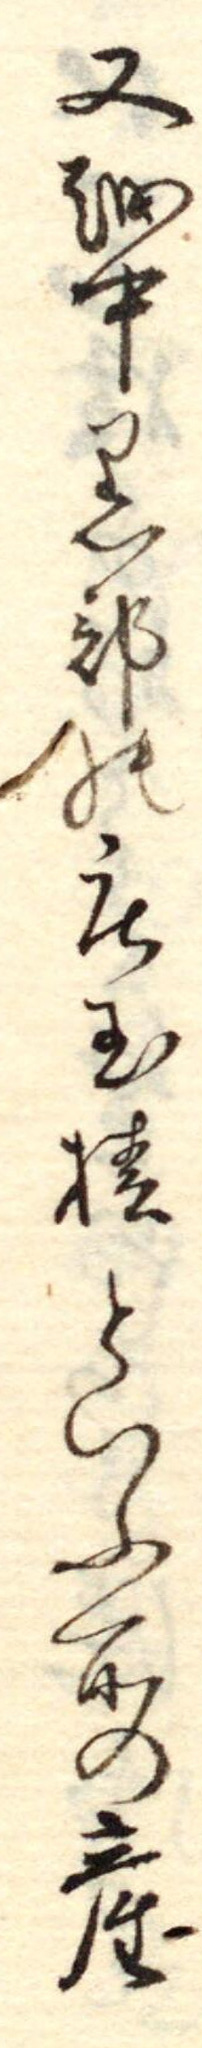又越中黒部の庄玉椿といふ所の産
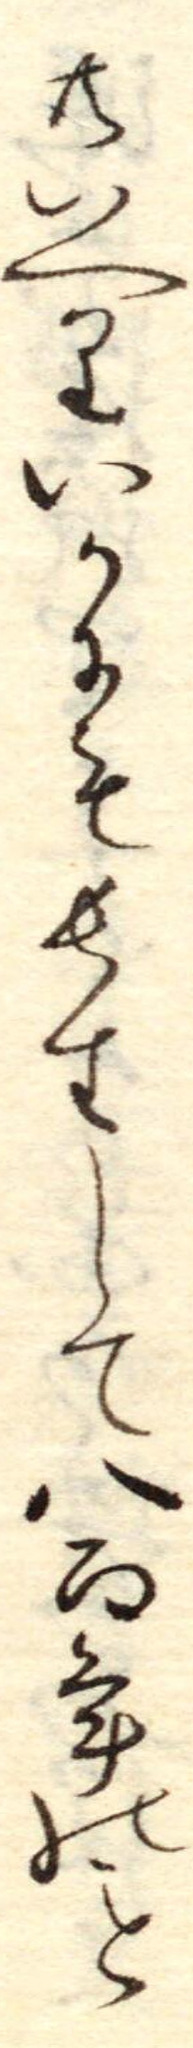共いへりいかにも長生して八百年のこと
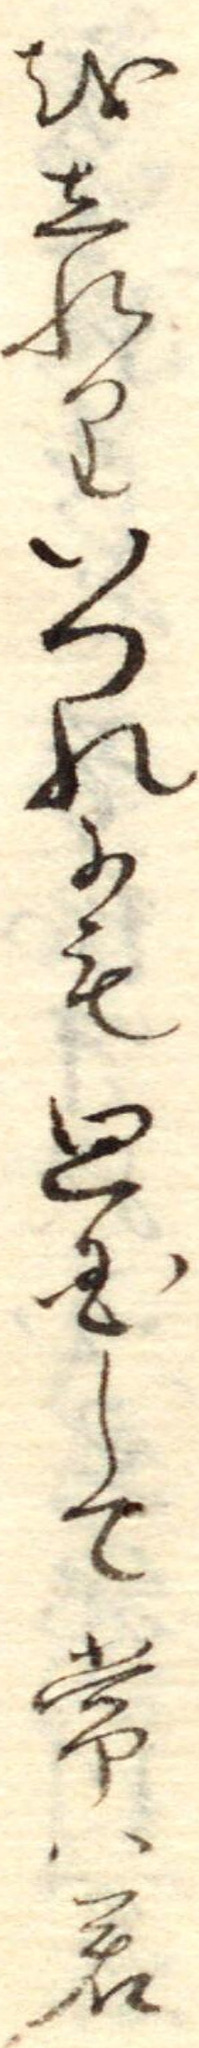をしれりいつれにも廻国して常は若
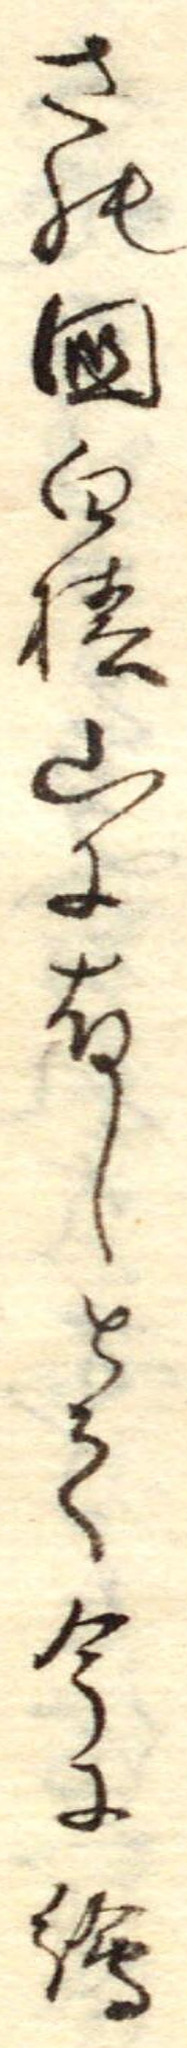さの国白椿山に有しとて今に絵
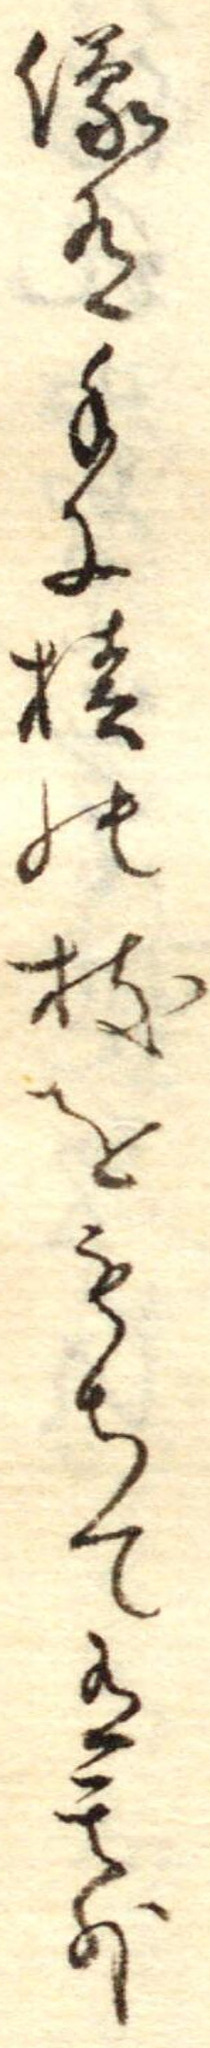像有手に椿の枝をもちて有其外

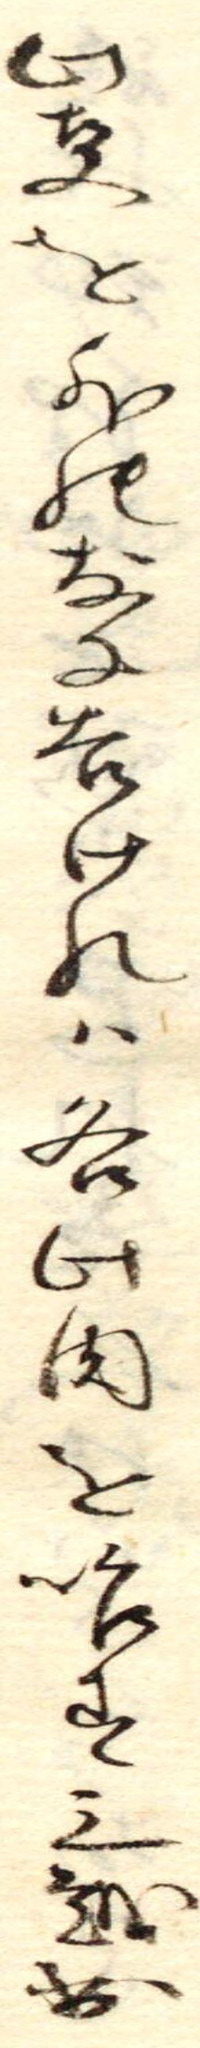此事を外の友に告けれは各此肉を咋す三越出
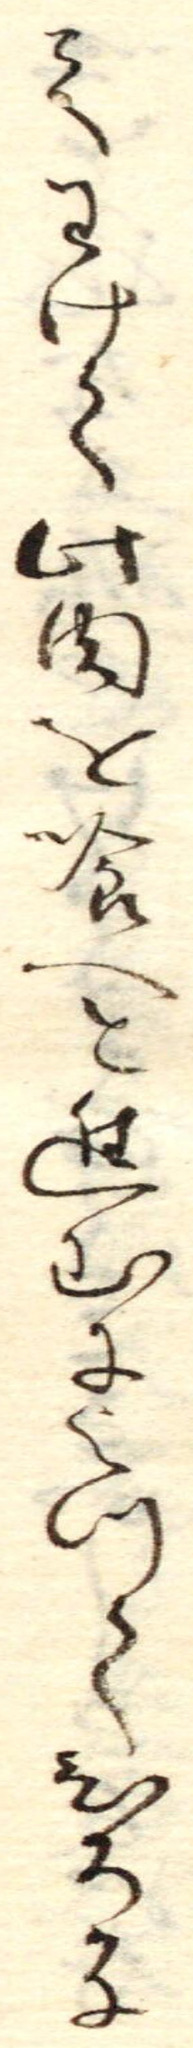てわけて此肉をく喰へと進むによつてひそかに
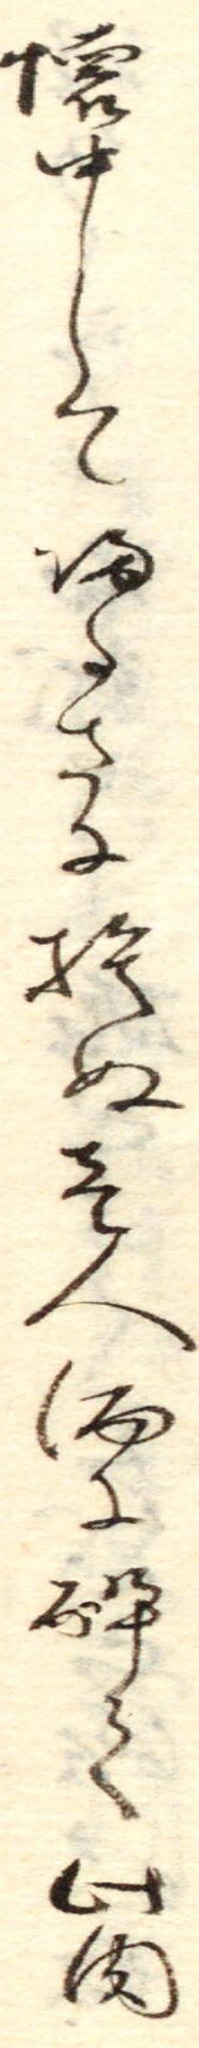懐中して帰るさに捨てぬ壱人酒に酔いて此肉
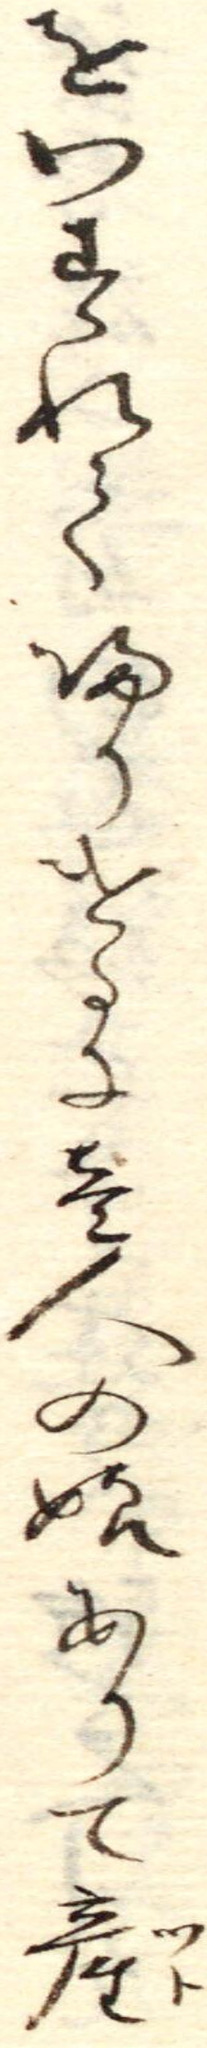をわすれて帰りけるに壱人の娘ありて産
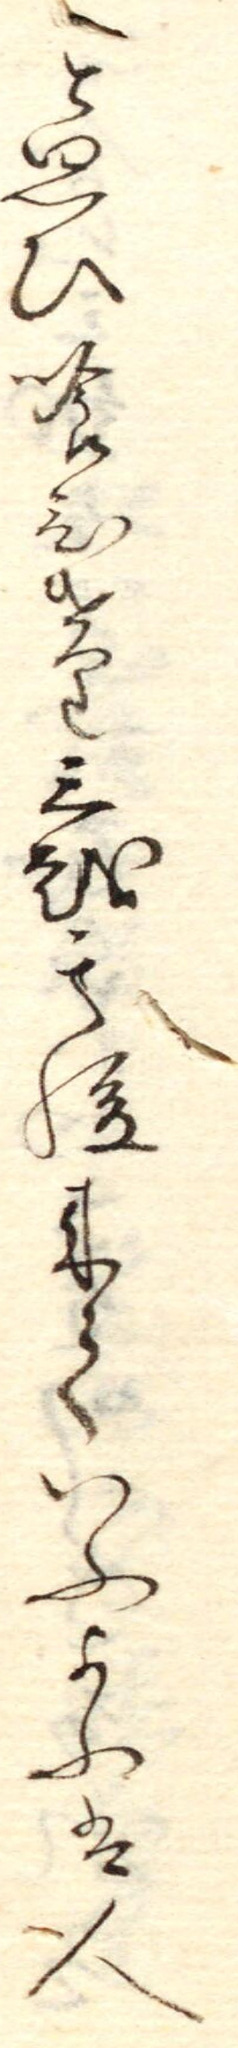と思ひ喰ひけり三越其後来ていふよふは人
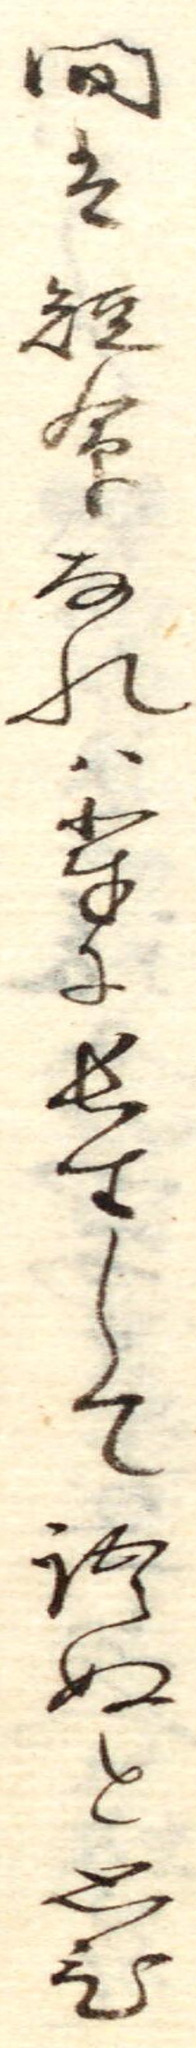間は短命なれは輩に長生して語ぬと思ひ
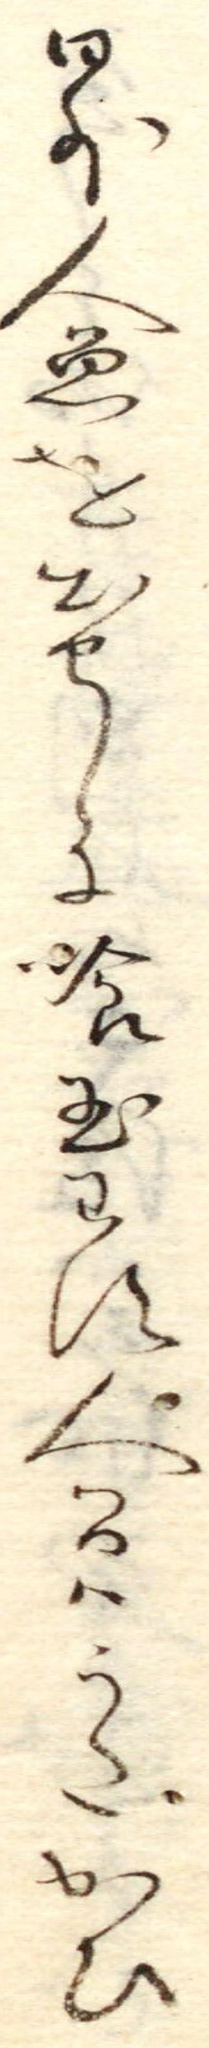日外人魚を出せしに喰玉わす人間はうたかひ
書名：能登名跡誌
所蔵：Ishikawa Prefectural Library
